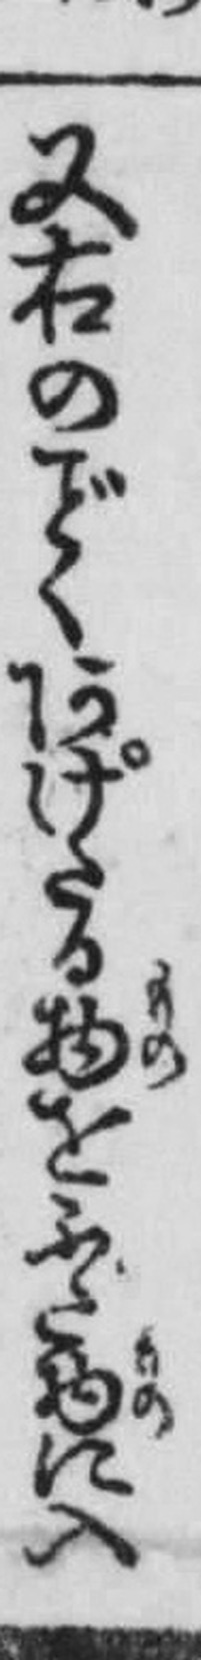又右のごとくあげたる物をふた物に入
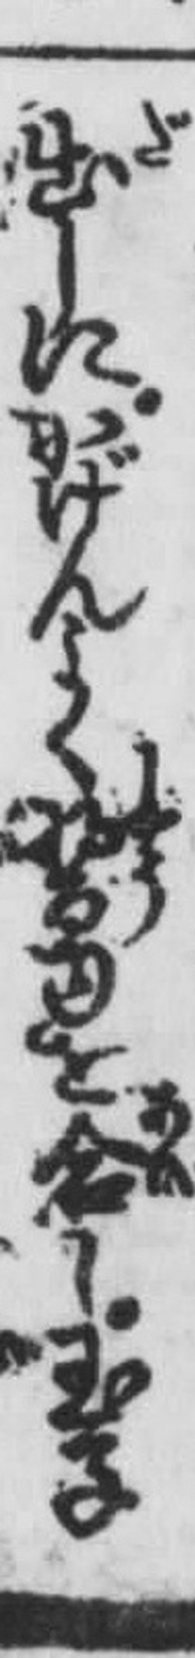出しにかげんよく醤ゆを合し玉子
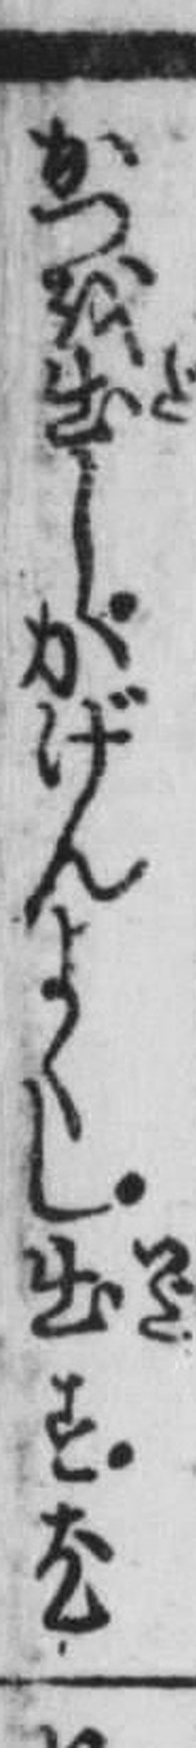かつを出しかげんよくし。出す。尤
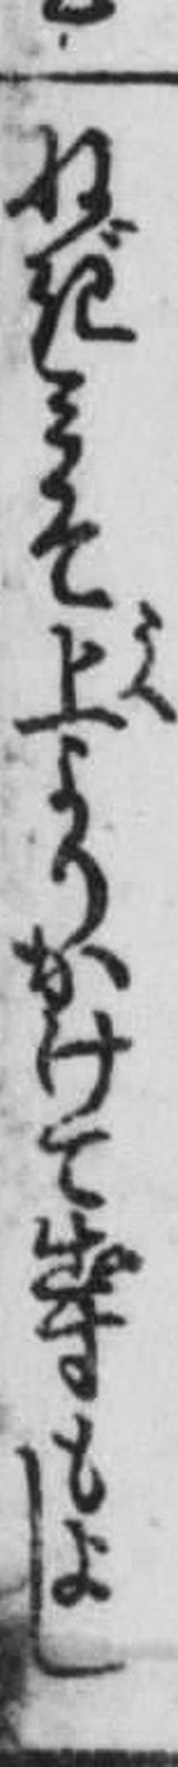ねぎみそ上よりかけて出すもよし
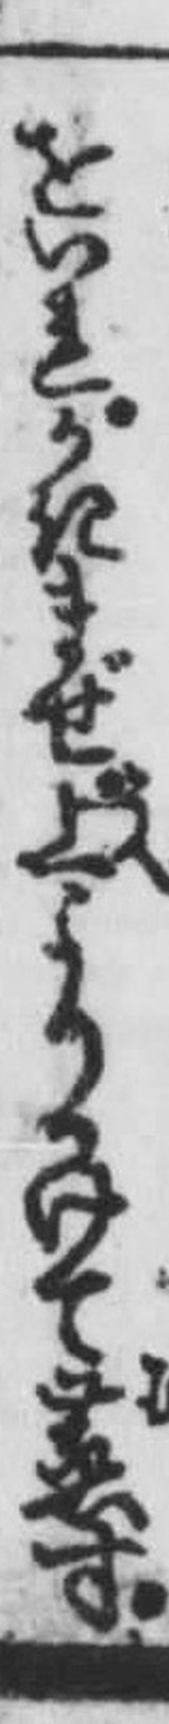をいれかきまぜ上よりかけて蒸す
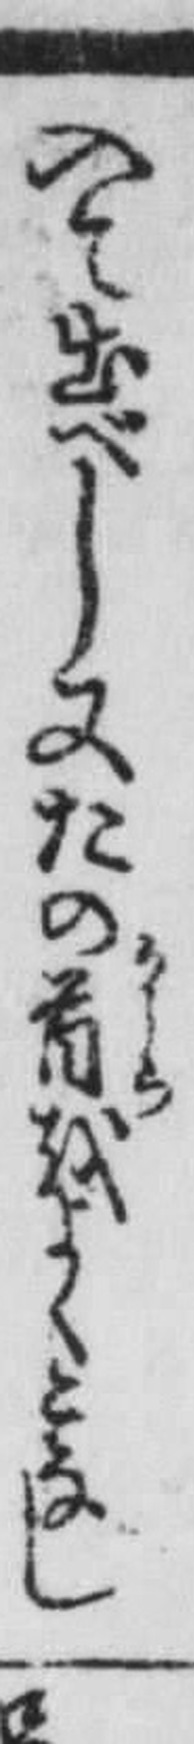入て出べし又たの頭をよくこなし
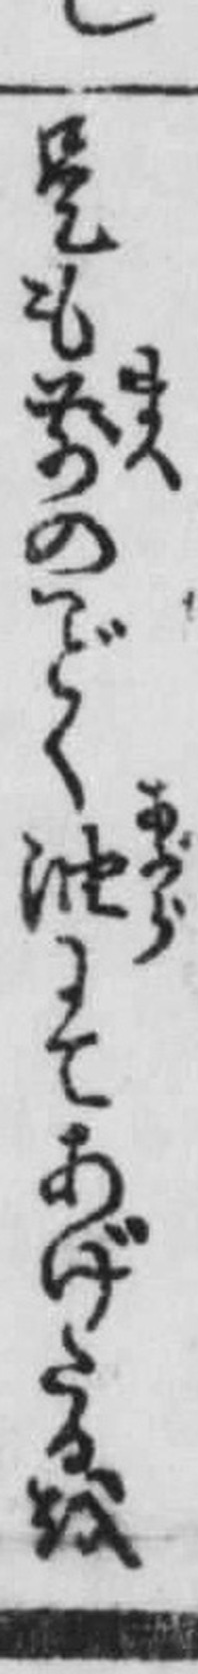是も前のごとく油にてあげたるを
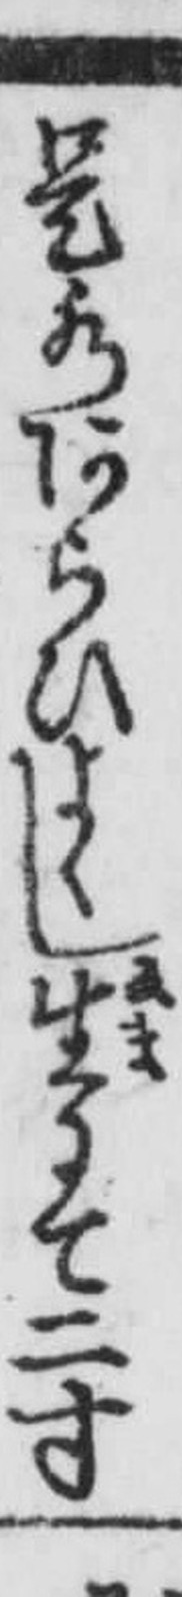是水あらひよくし生にて二寸
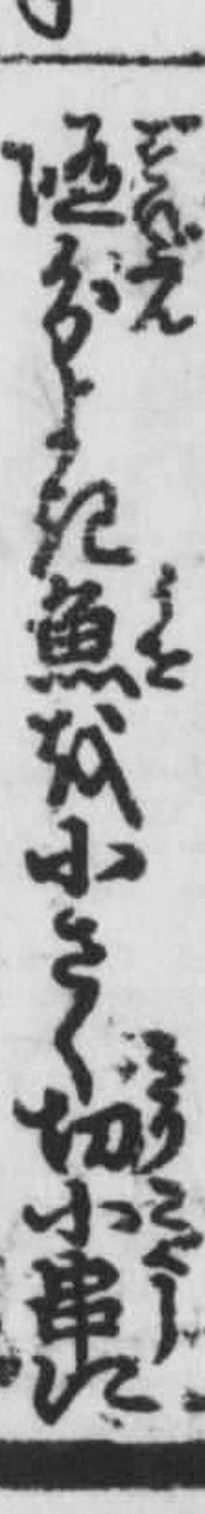随分よき魚を小さく切小串に
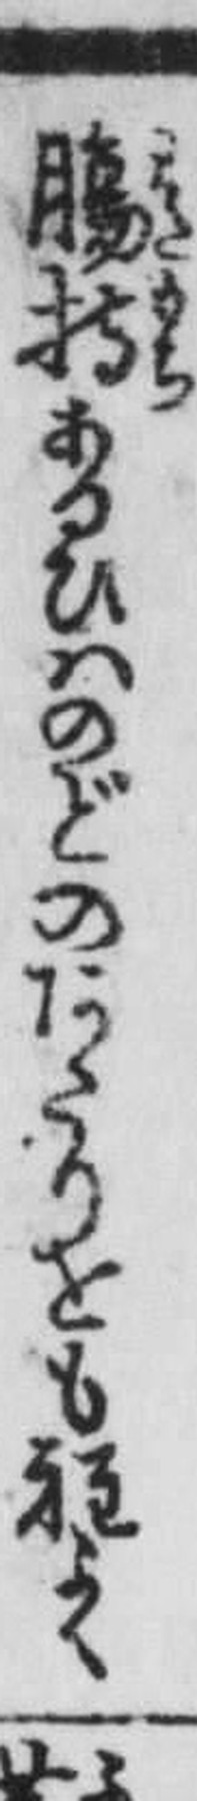腸持あるひはのどのあたりをも程よく
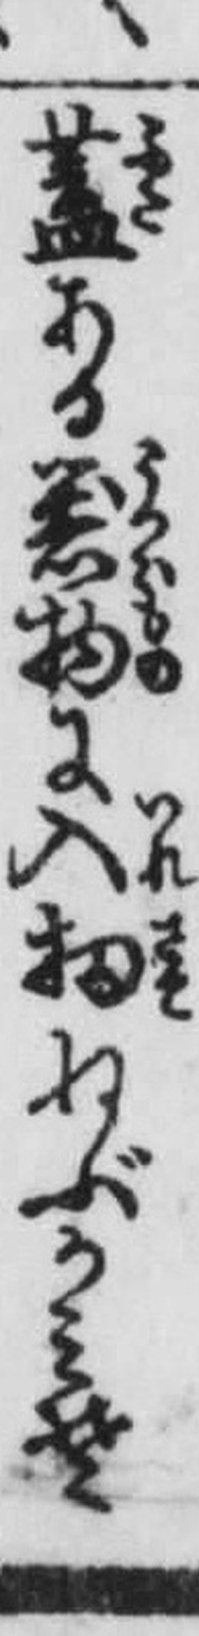蓋ある器物に入扨ねぶかみそ
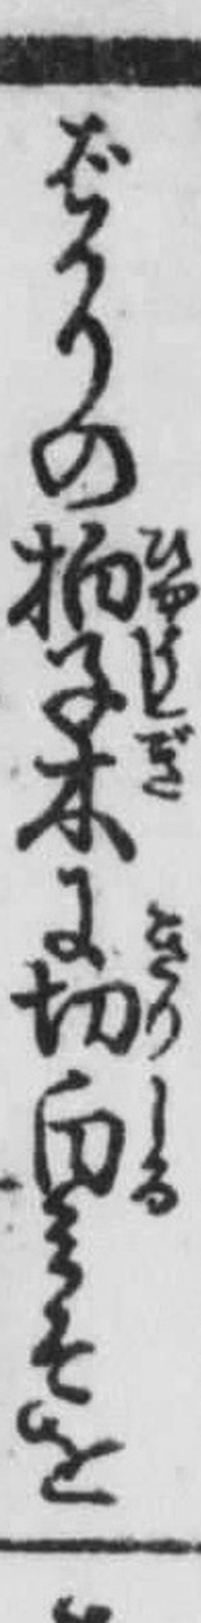ばかりの柏子木に切白みそを
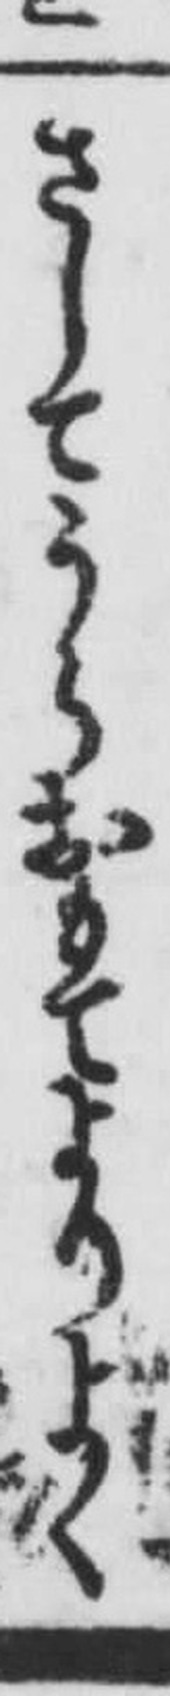さしてうらおもてよりよく
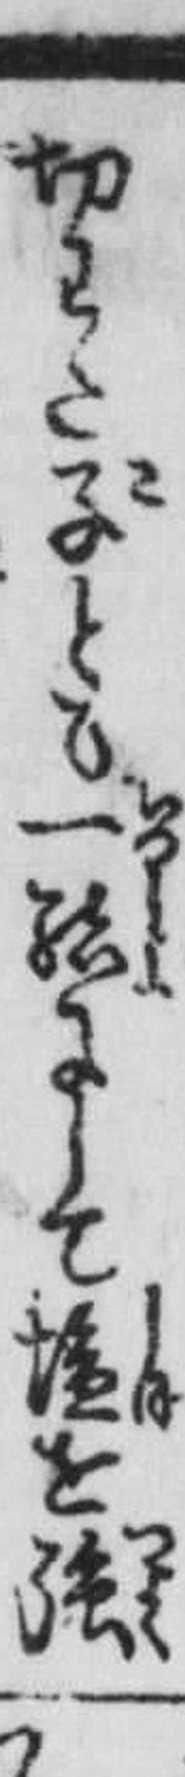切わた子とも一緒にして塩を強
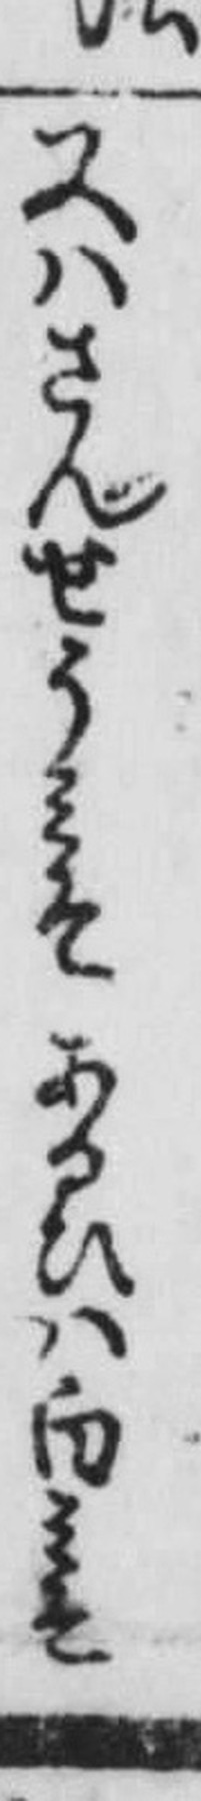又はさんせうみそあるひは白みそ
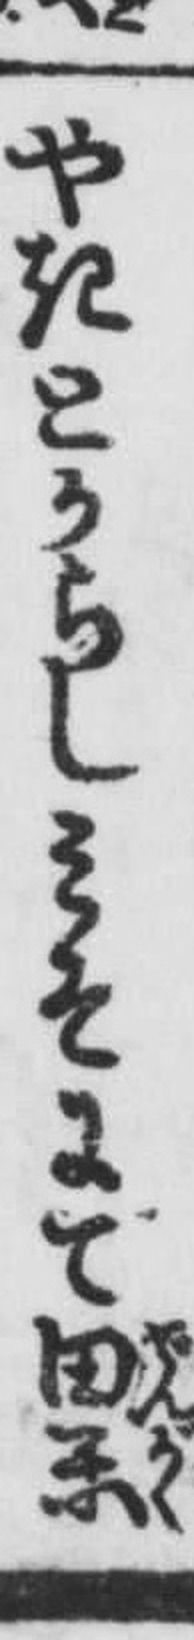やきとからしみそにて田楽
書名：精進魚類間合料理/早速庖丁
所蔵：大阪府立大学学術情報センター 国文学研究資料館
